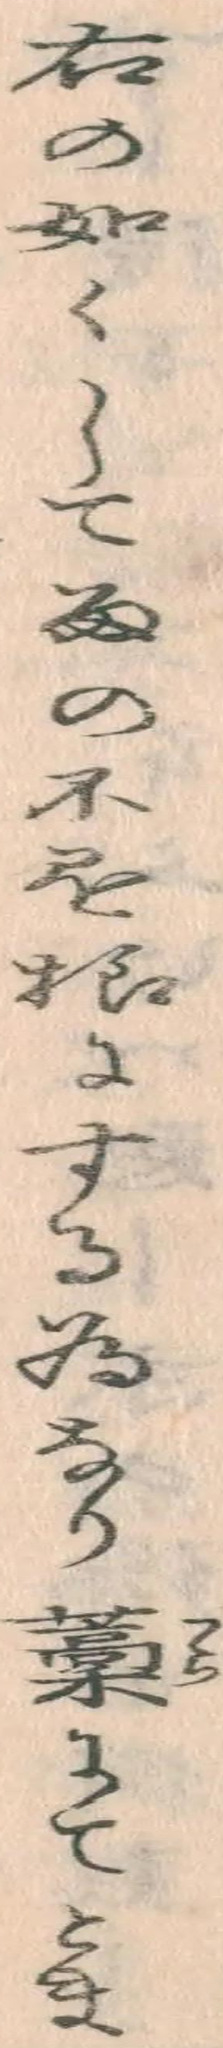右の如くして雨の不懸様にする為なり藁にてとま
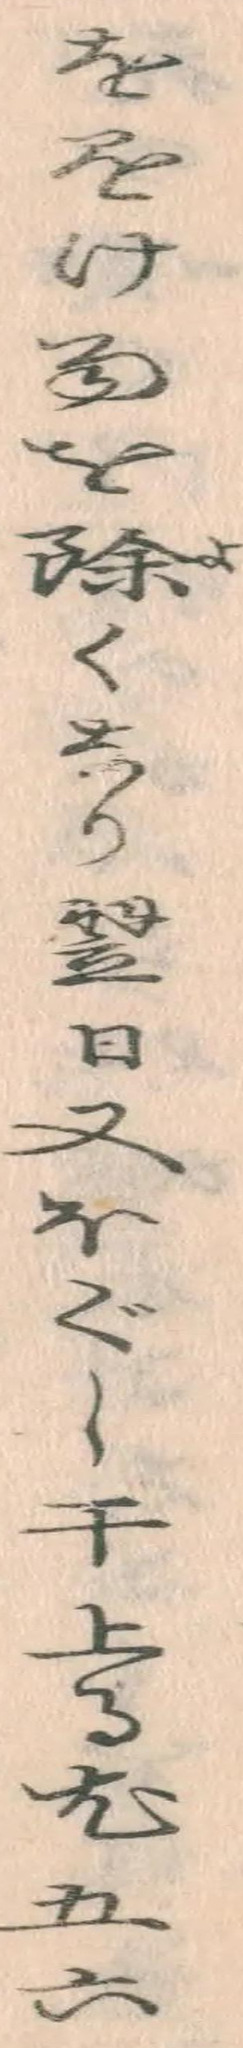を懸け雨を除くなり翌日又ほぐし干上る尤五六
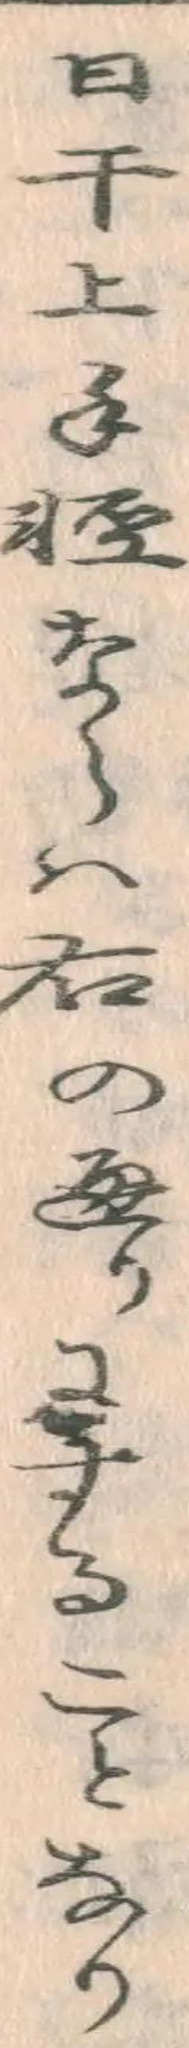日干上手軽ならは右の通りにすることなり
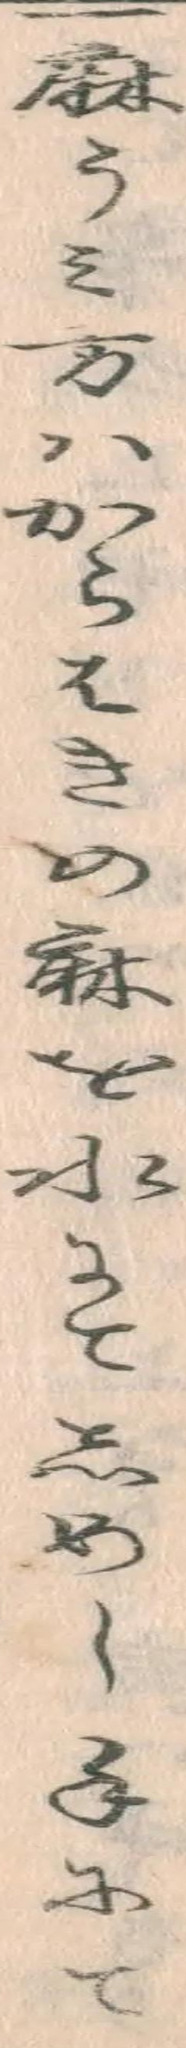一麻うみ方はからはきの麻を水にてしめし手にて
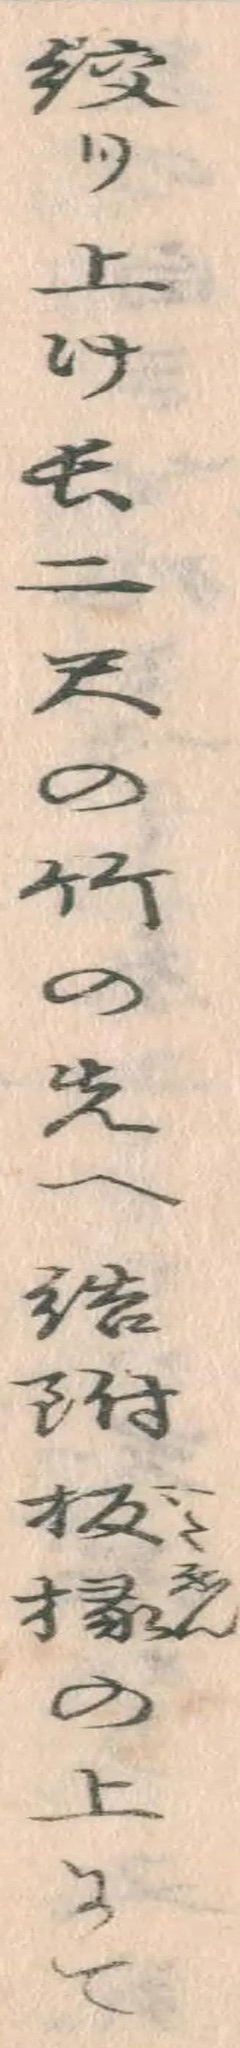絞り上け長二尺の竹の先へ結附板椽の上にて
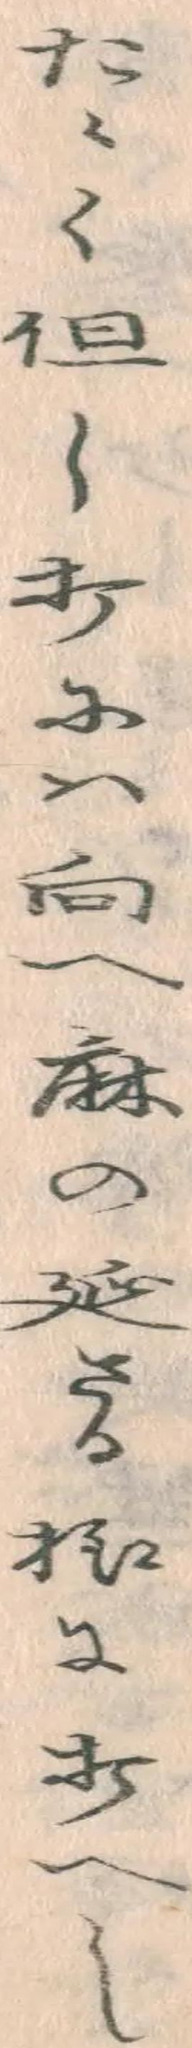たゝく但し打には向へ麻の延さる様に打へし
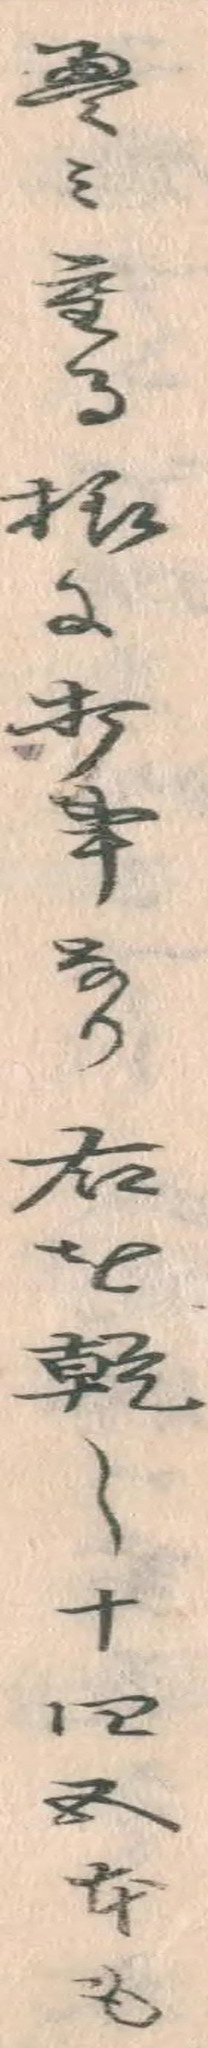畳み重る様に打事なり右を乾し十四五本も
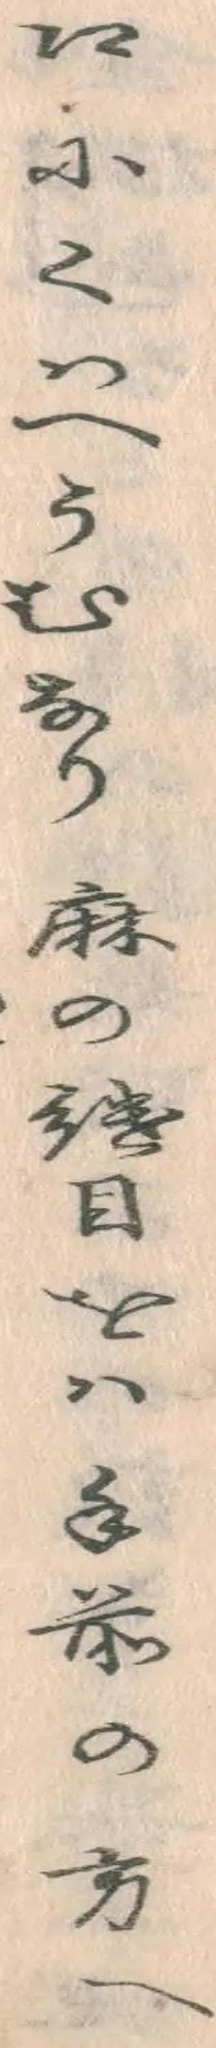口にくはへうむなり麻の継目をは手前の方へ
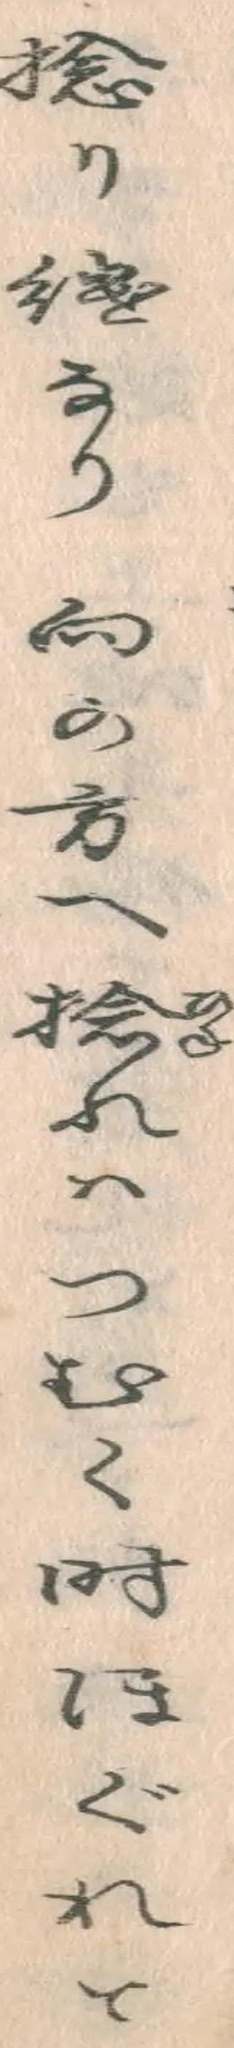捻り継なり向の方へ捻れはつむく時ほぐれて
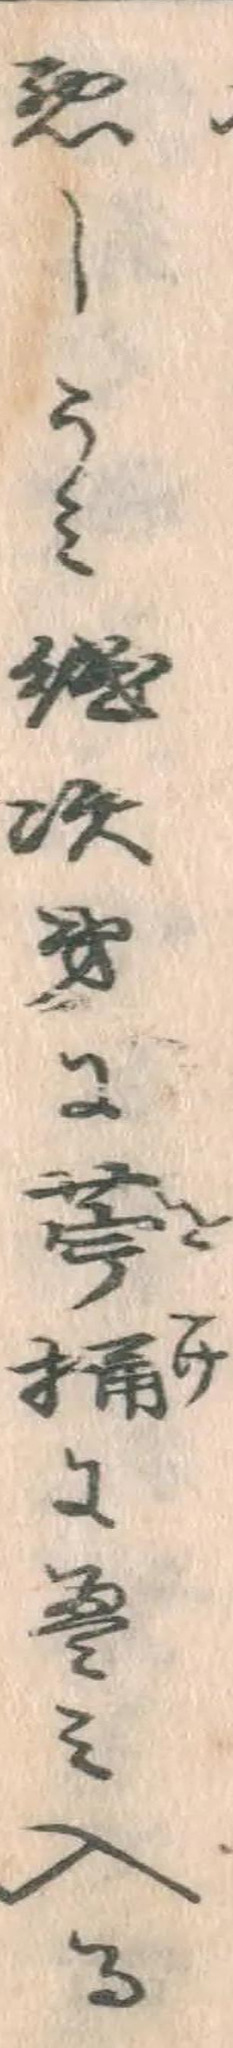悪しうみ継次第に苧桶に畳み入る
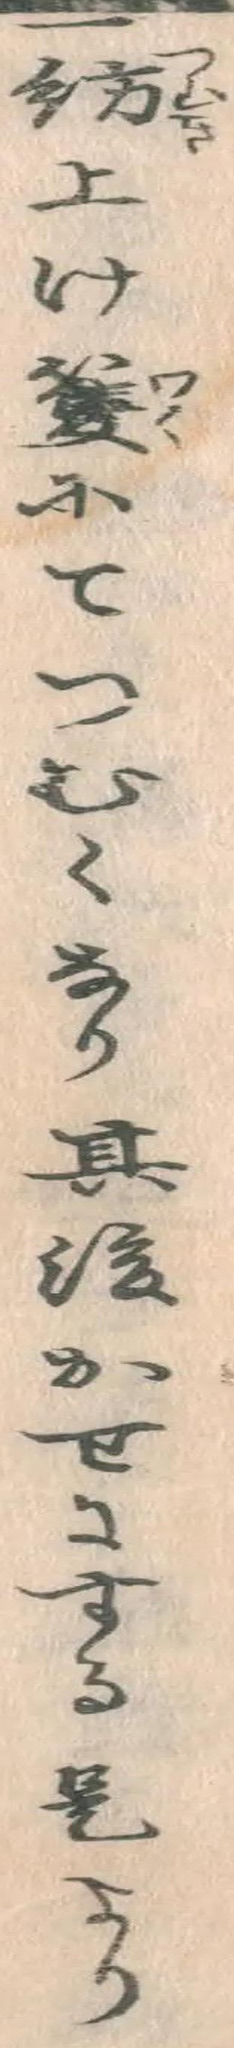一紡上け篗にてつむくなり其後かせにする是より
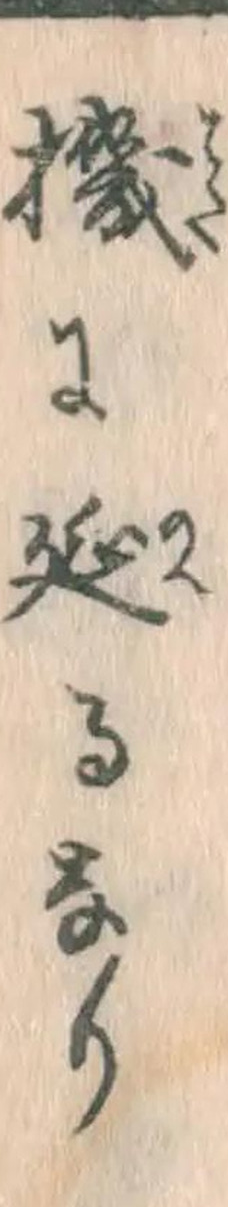機に延るなり
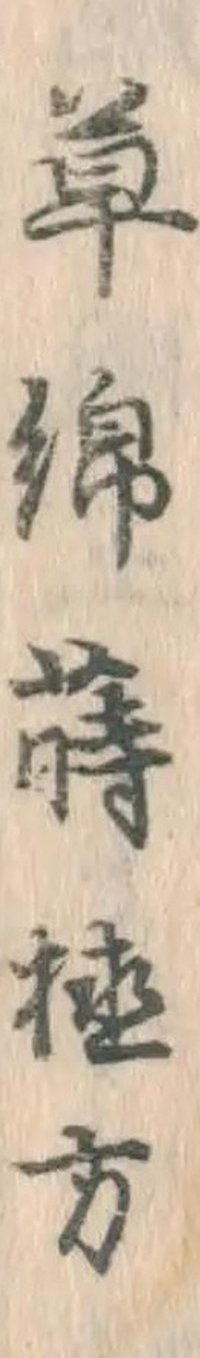草綿蒔植方

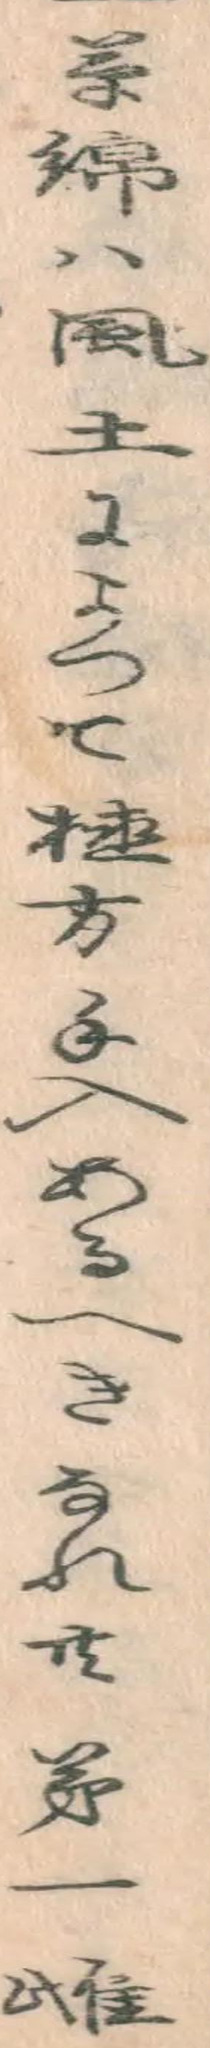一草綿は風土によつて植方手入あるへきなれ共第一雌
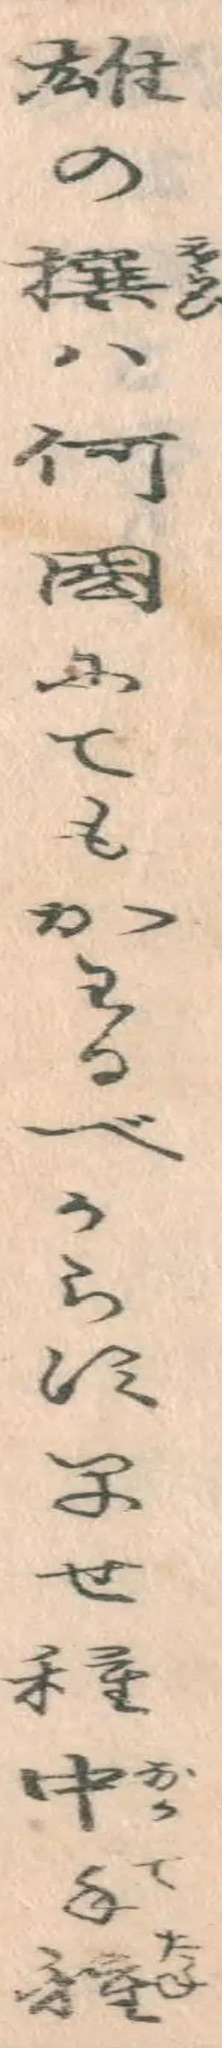雄の撰は何国にてもかわるべからす早せ種中手種
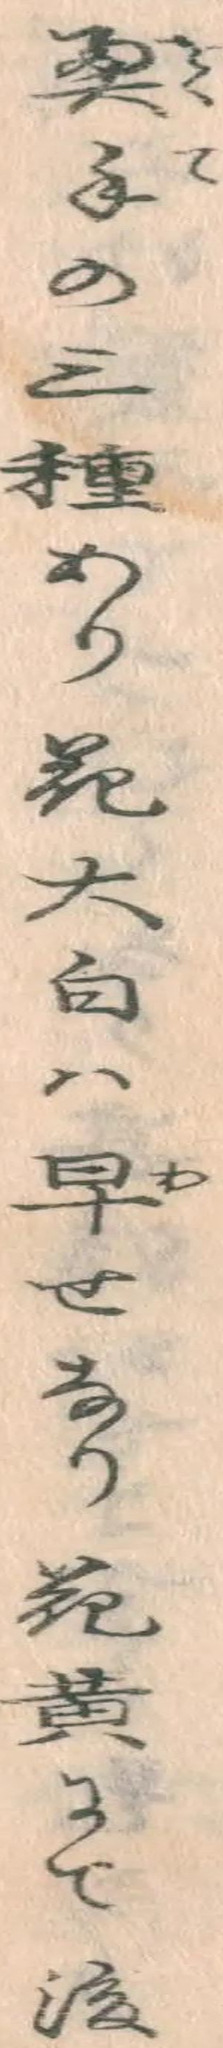奥手の三種あり花大白は早せなり花黄にて後
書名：機織彙編 5巻. [1]
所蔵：国立国会図書館 National Diet Library, JAPAN
